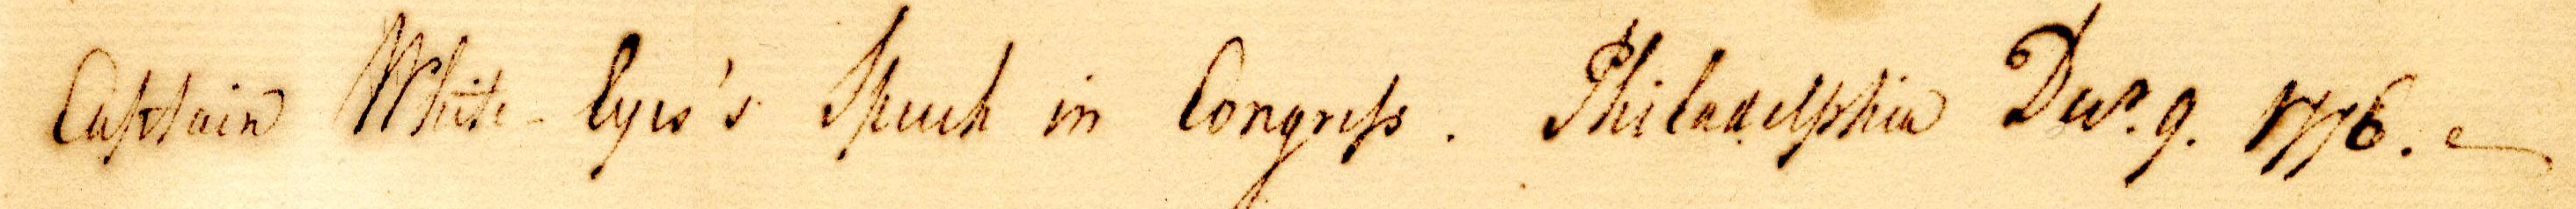Captain White Eyes's Speech in Congress. Philadelphia Dec^r. 9. 1776.-
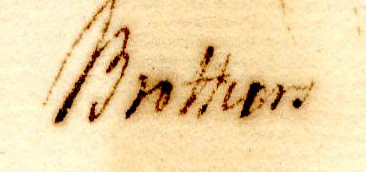Brothers
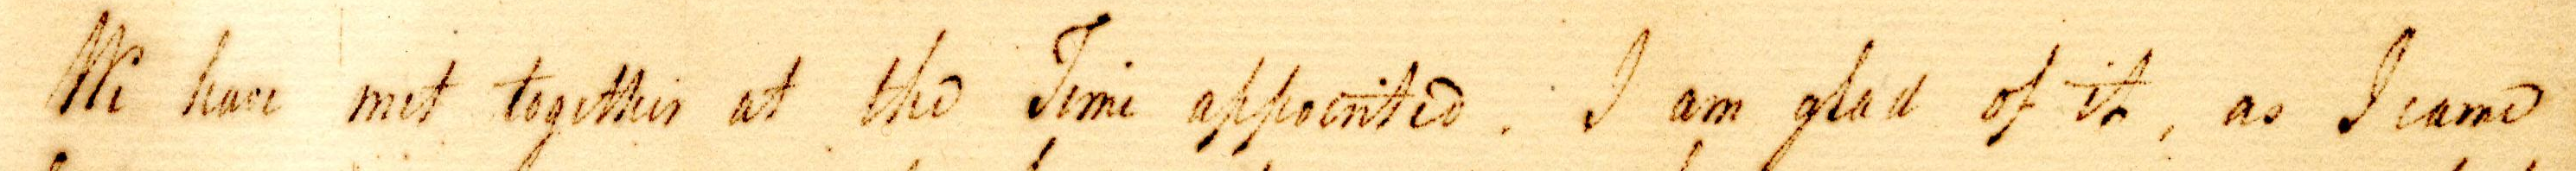We have met together at the Time appointed. I am glad of it, as I came
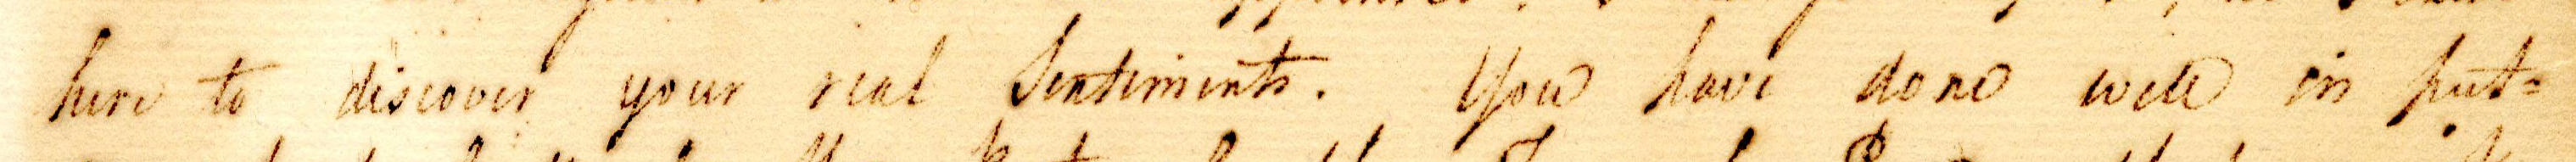here to discover your real Sentiments. You have done well in put-
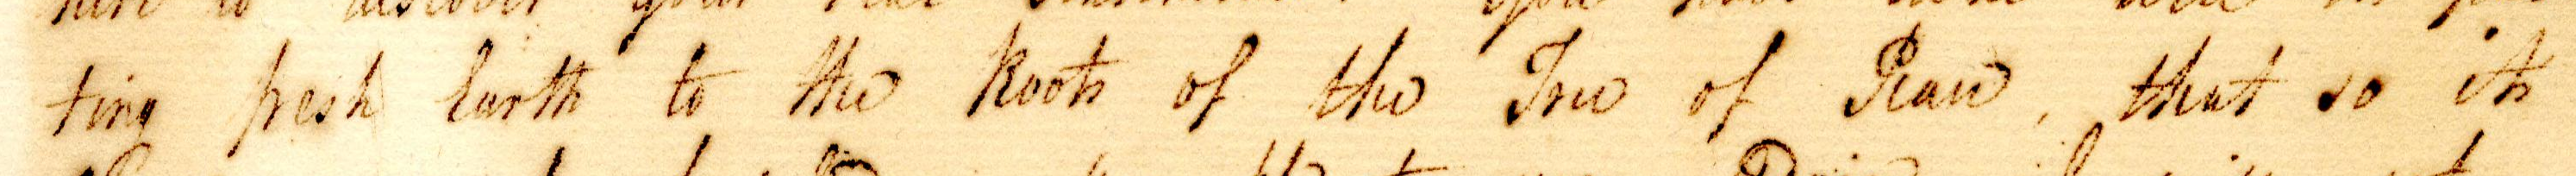ting fresh Earth to the Roots of the Tree of Peace, that so its
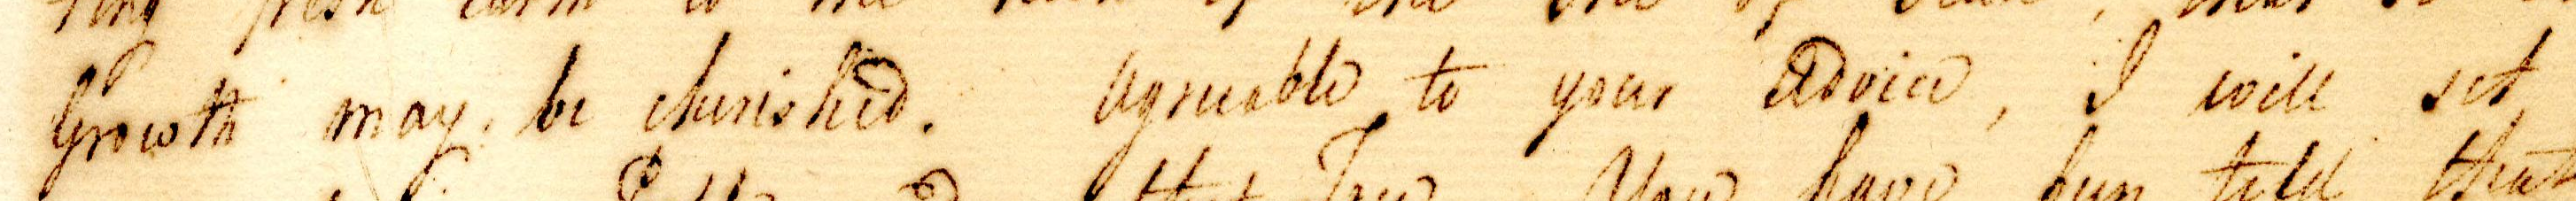Growth may be cherished. Agreeable to your advice, I will set
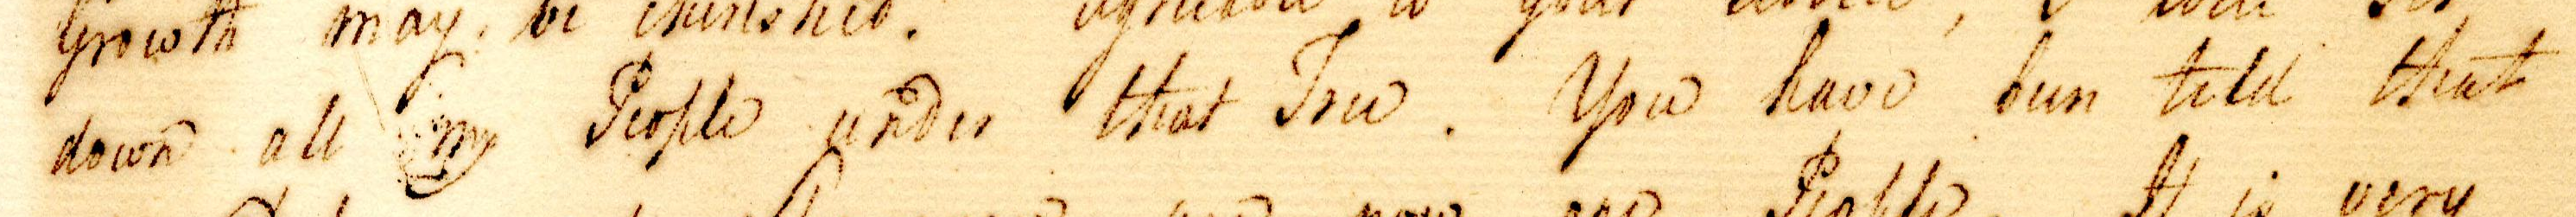down all my People under that Tree. You have been told that
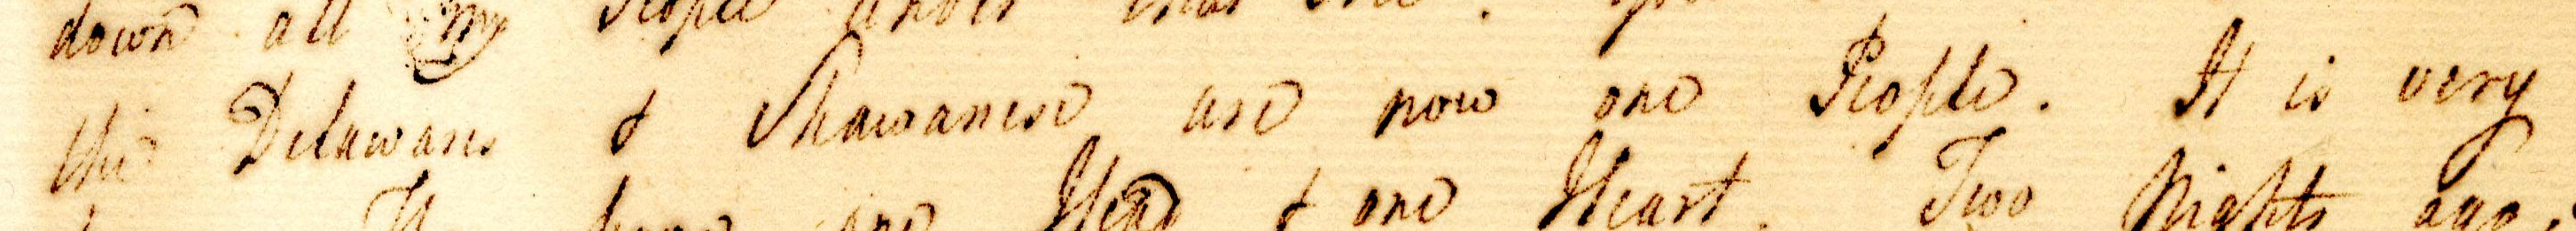the Delawares & Shawanese are now one People. It is very
